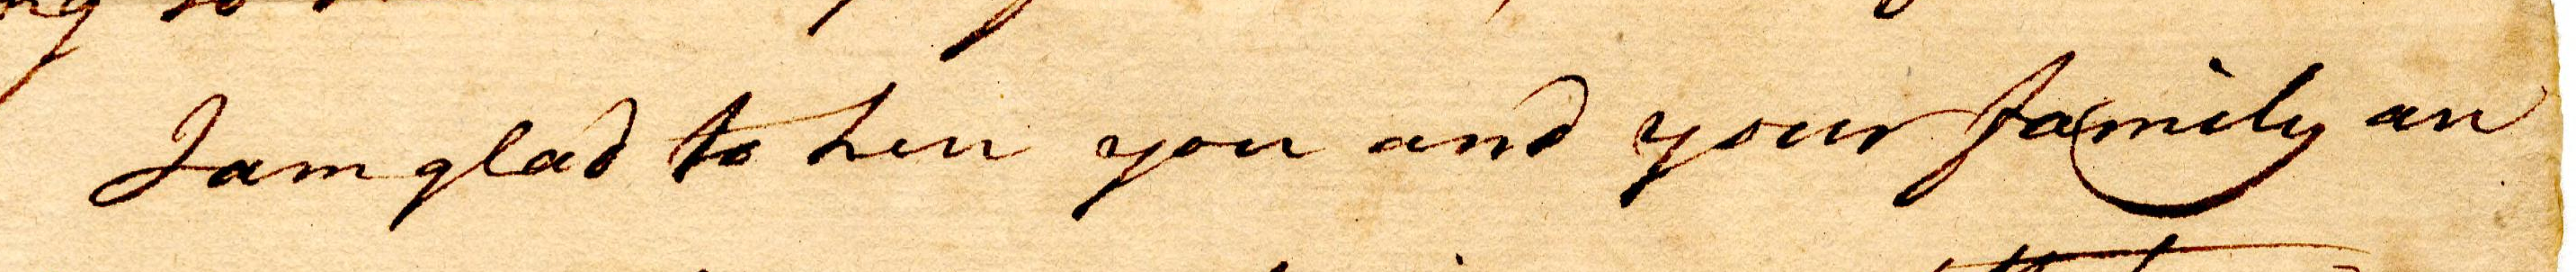I am glad to here you and your family are
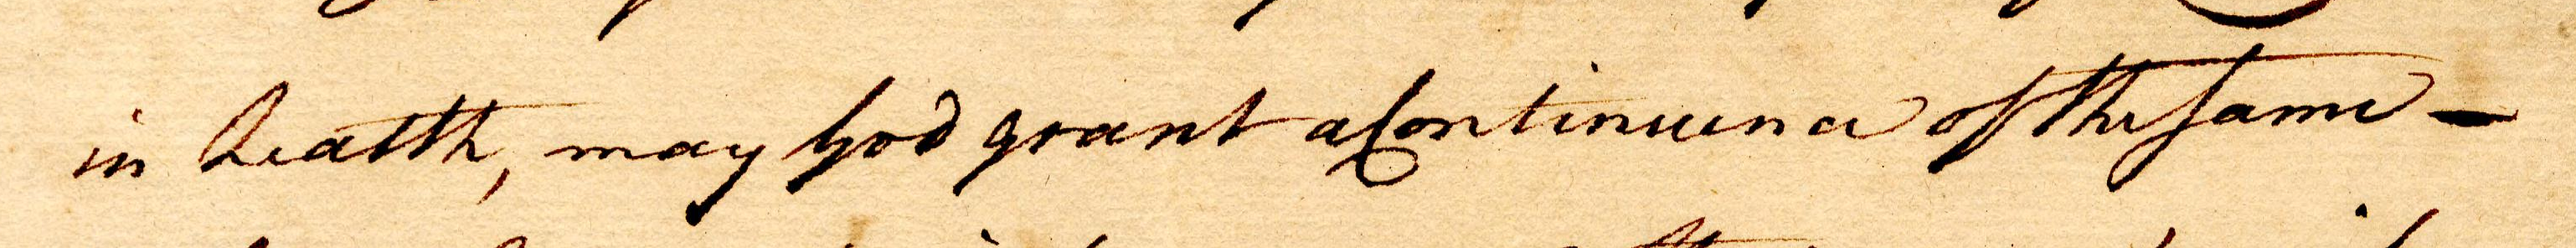in health, may God grant a Continuance of the same.-
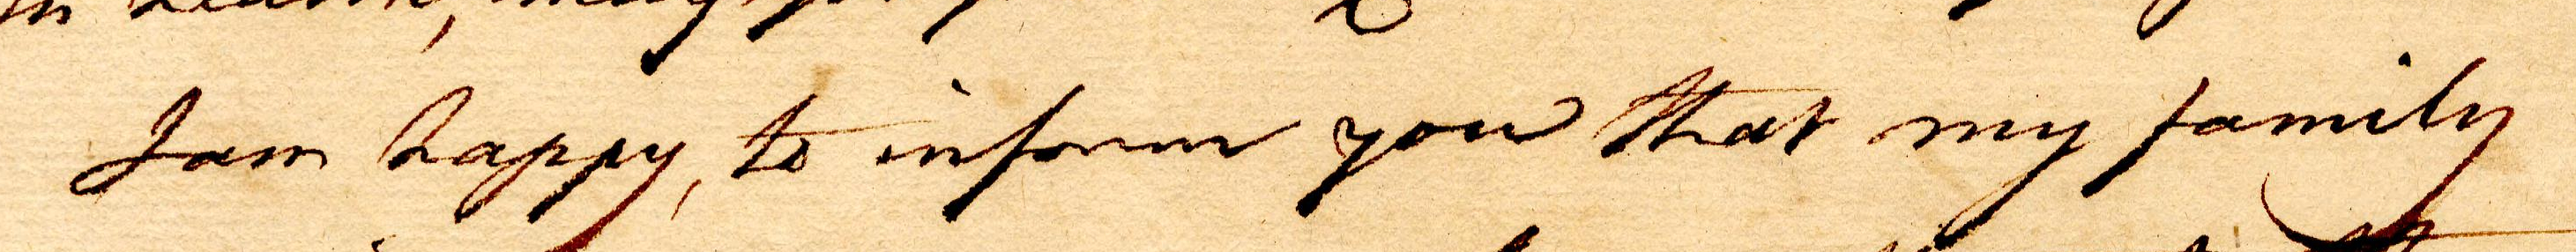I am happy, to inform you that my family
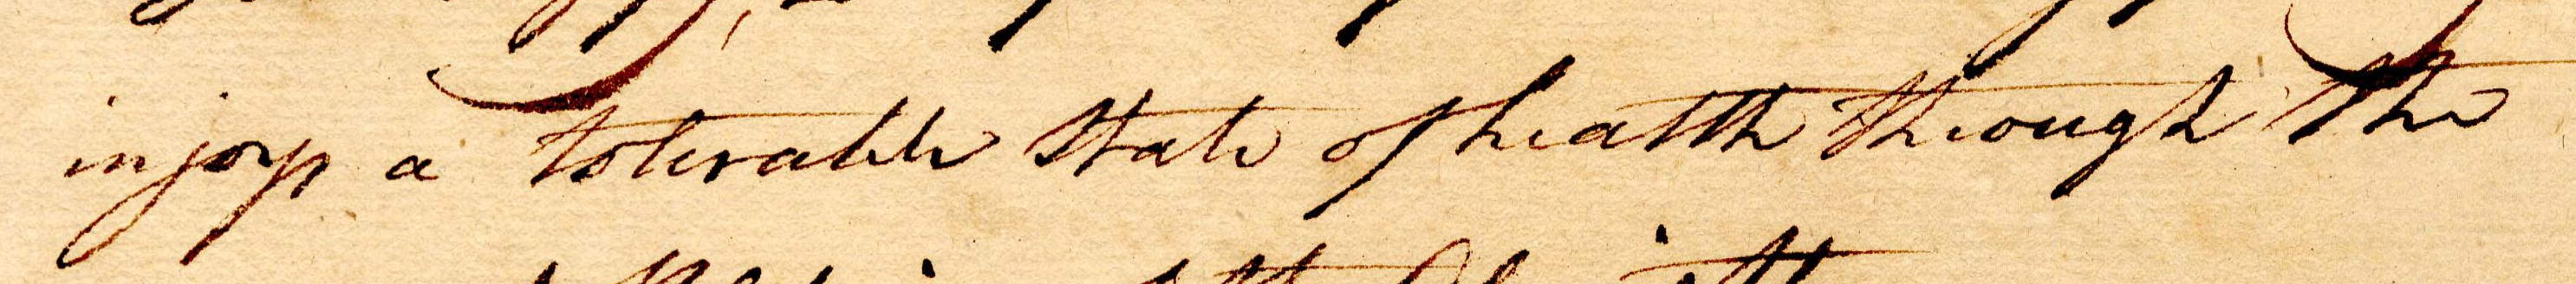enjoys a Tolerable state of health through the
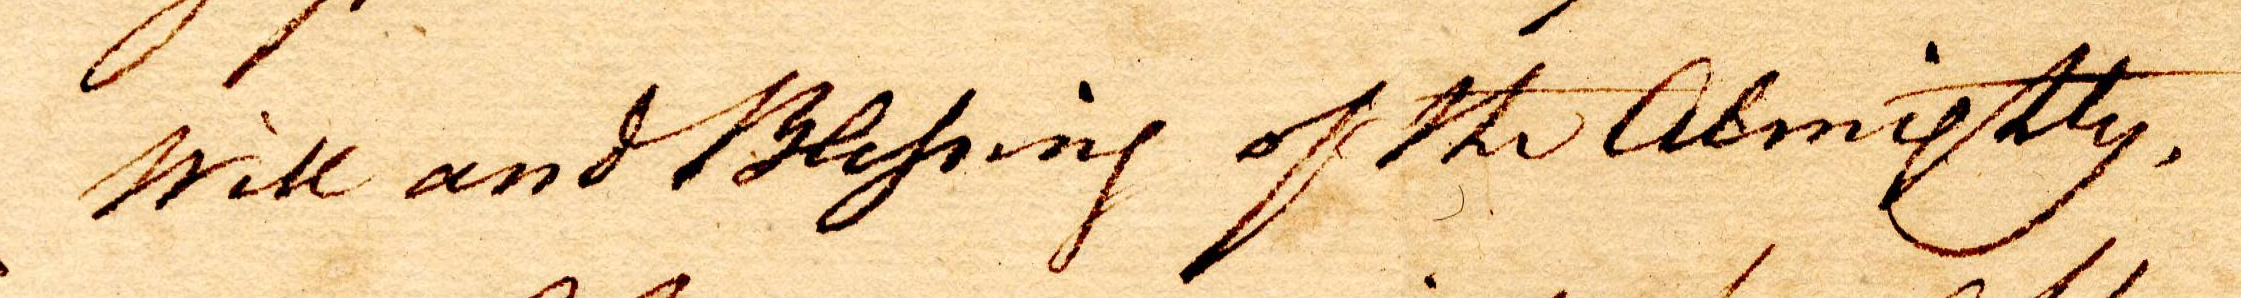will and Blessing of the Almighty
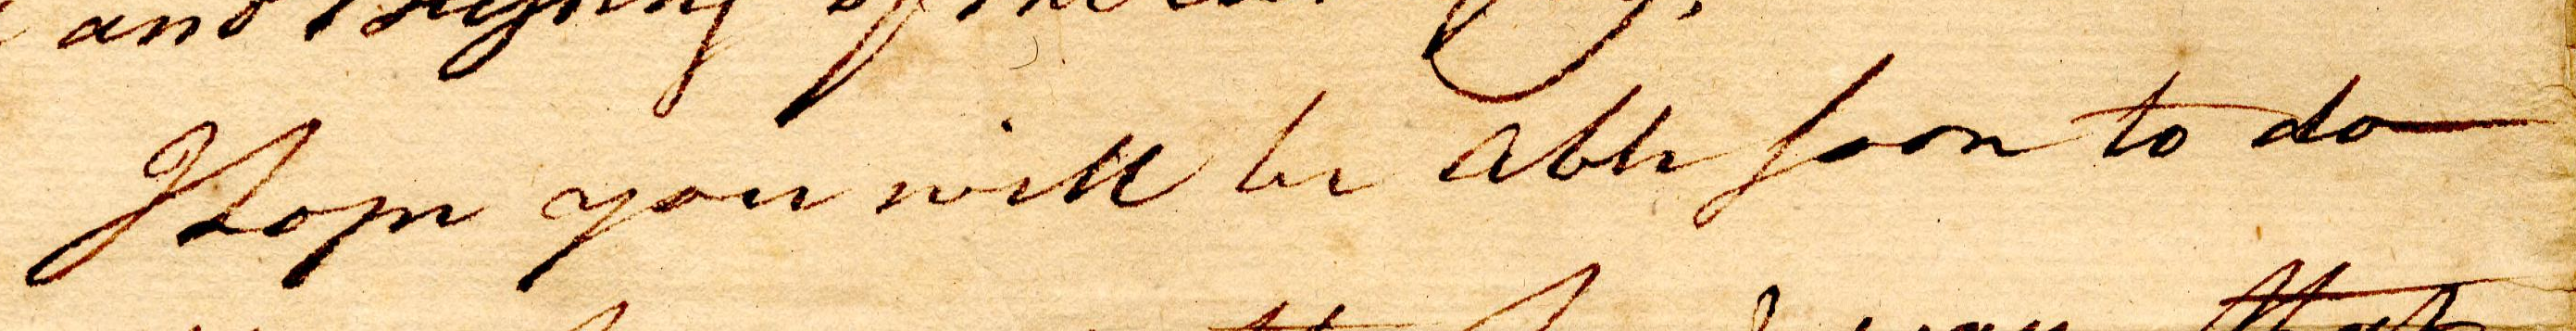I hope you will be Able soon to do
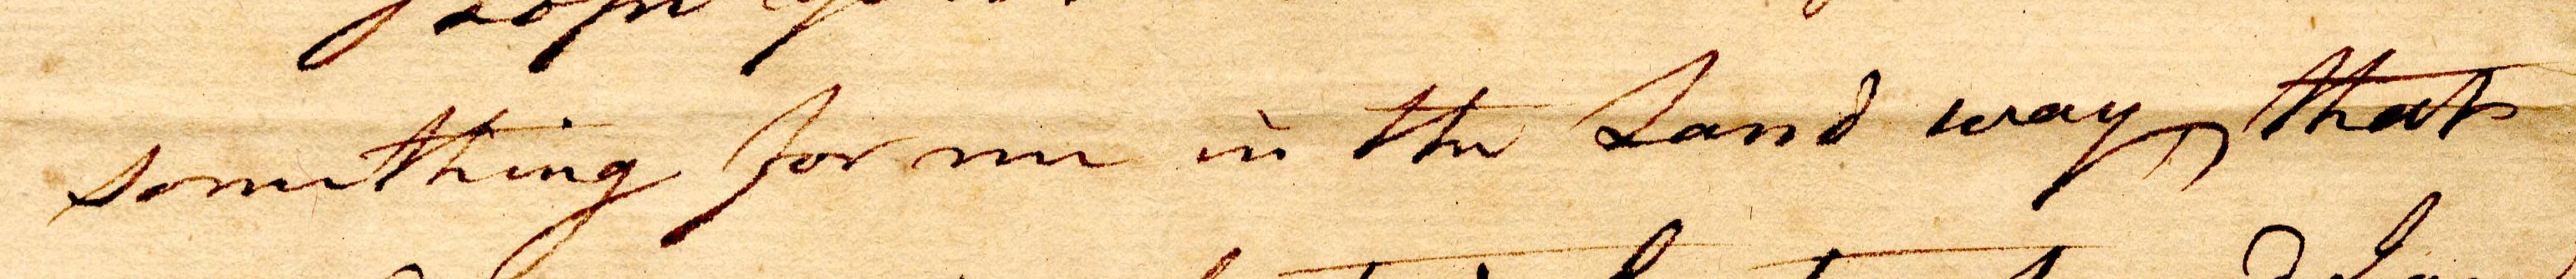something for me in the Land way that
